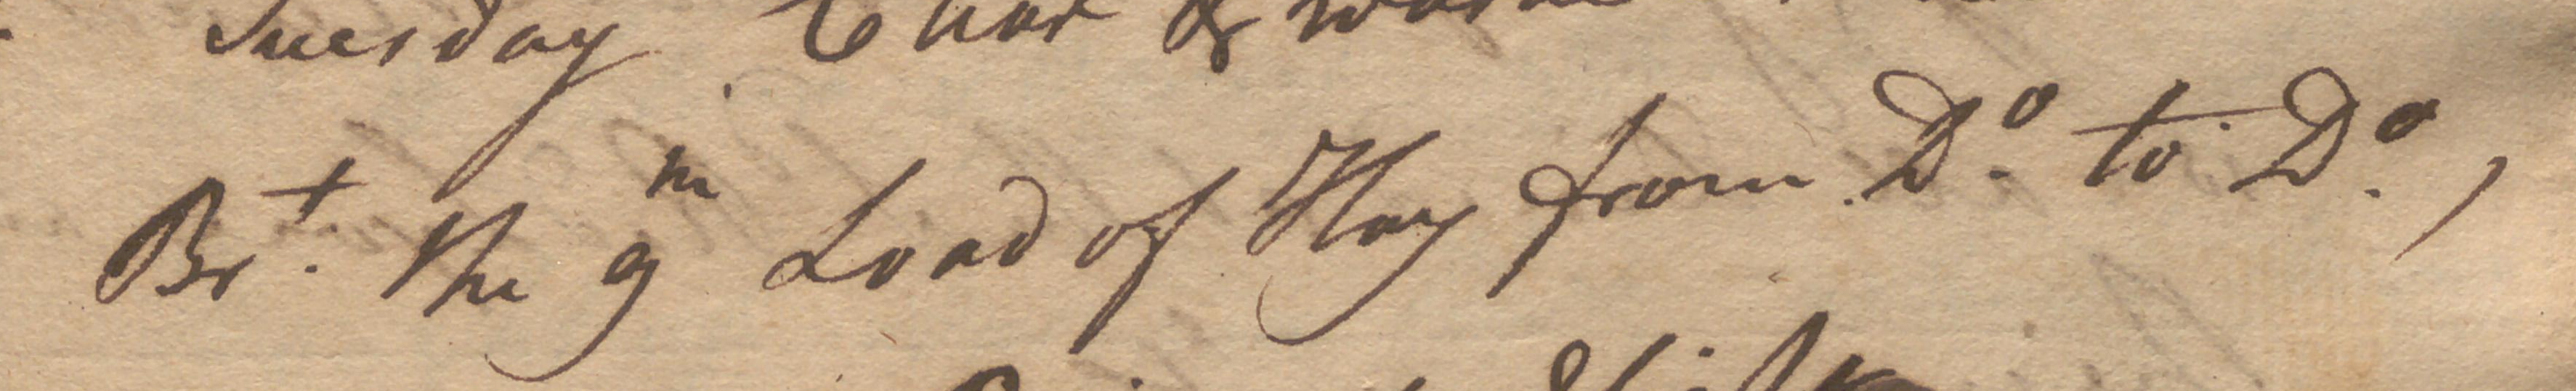Br^t. the 9^th. Load of Hay from D^o. to D^o.,
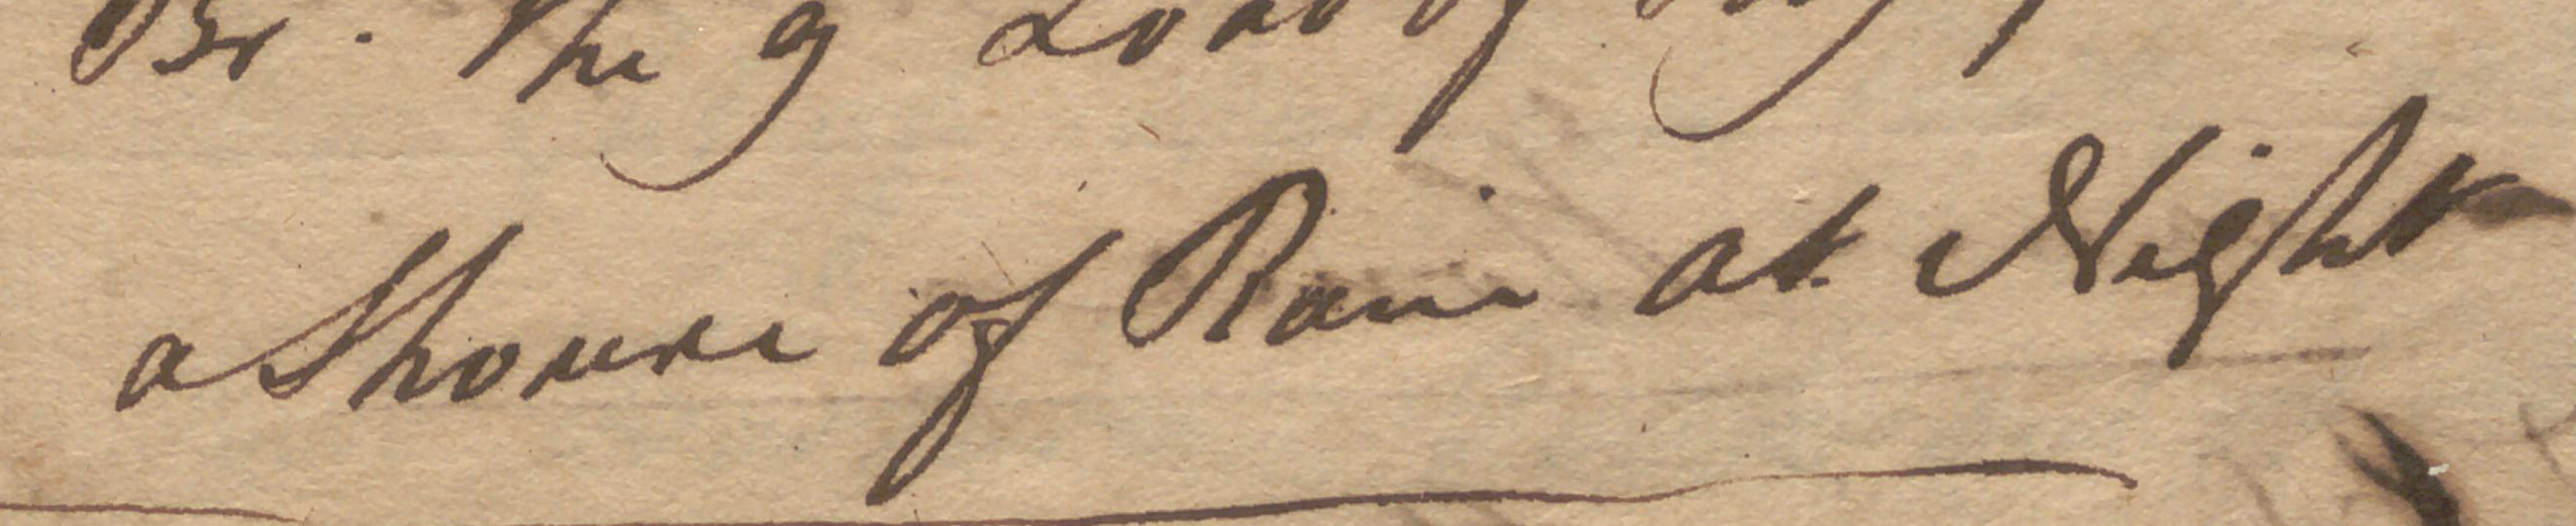a Shoure of Rain at Night
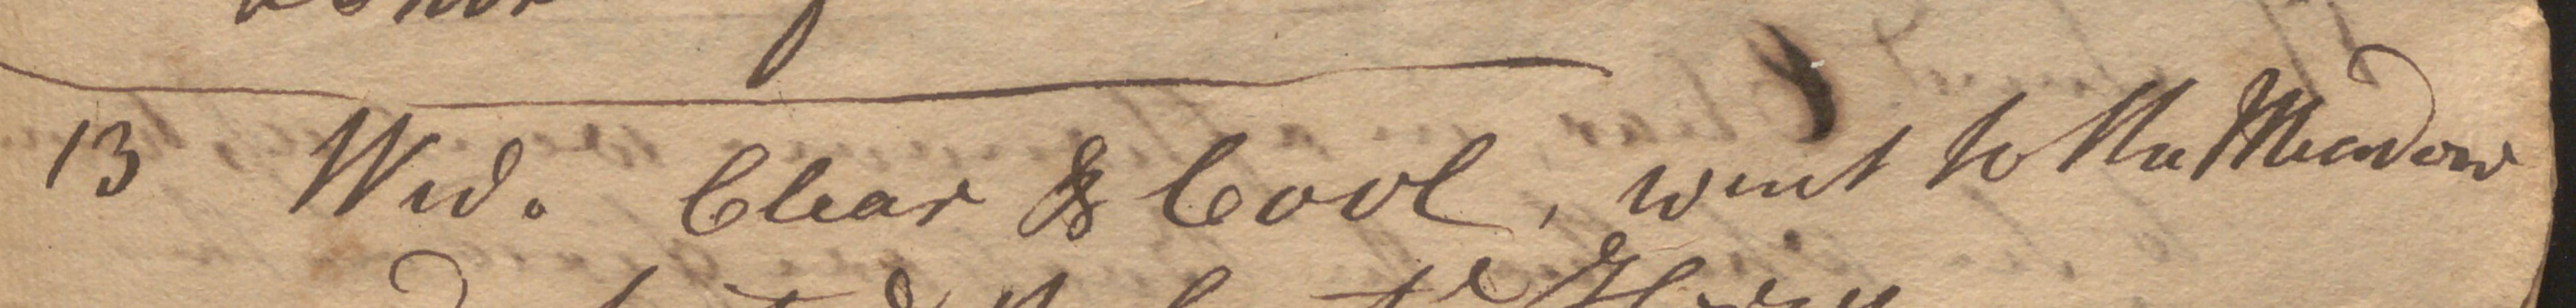13 Wed. Clear & Cool, went to the Meadow
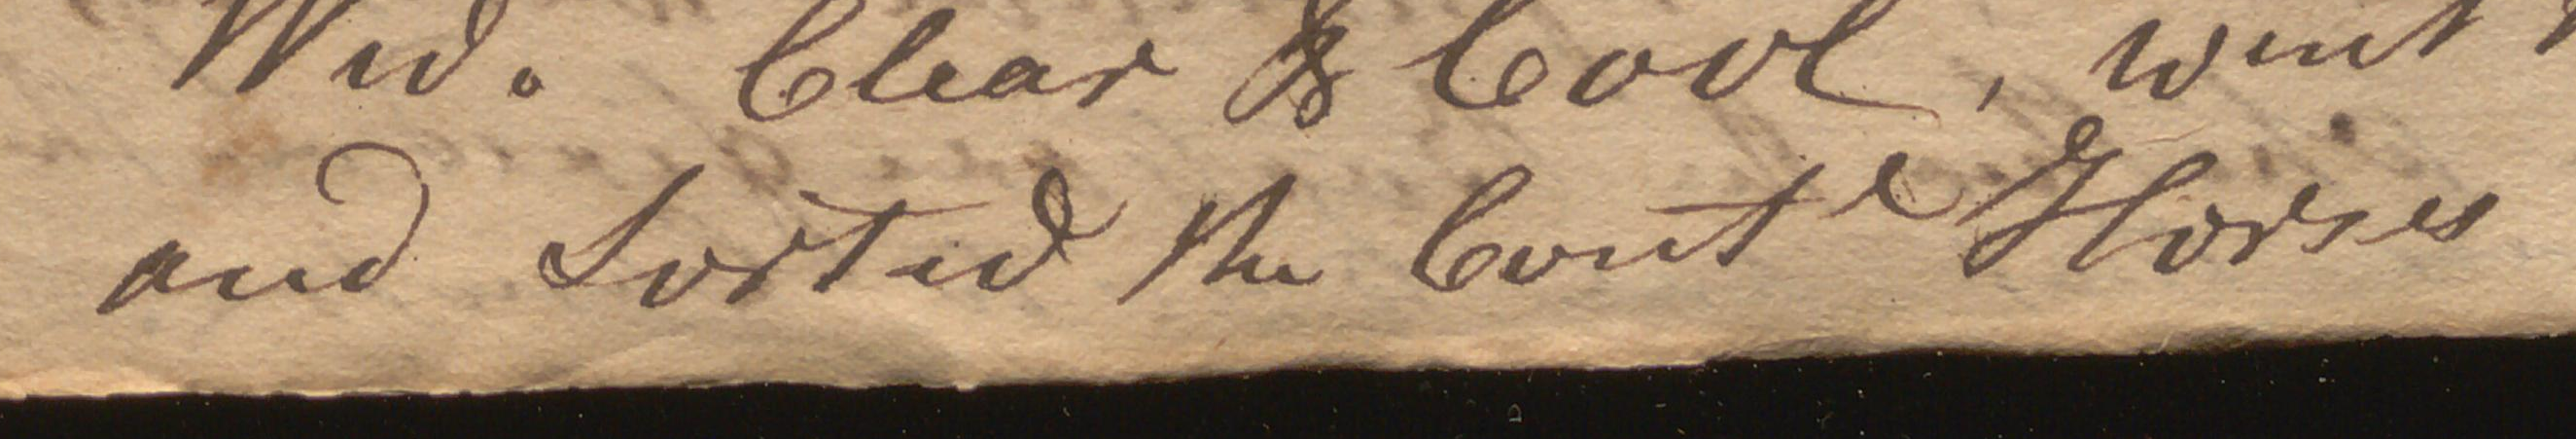aned Sorted the Cont^l Horses
